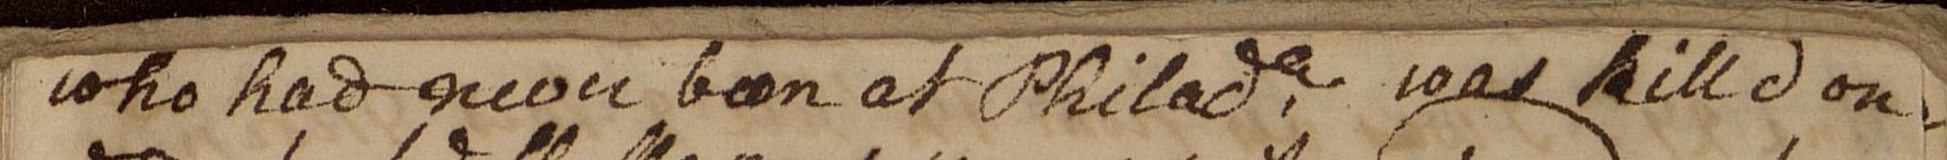who had never been at Philad^a. was killd on
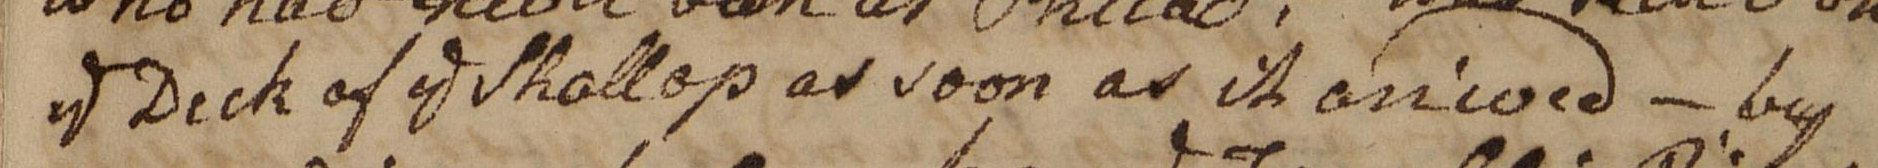y^e Deck of y^e Shallop as soon as it arrived- by
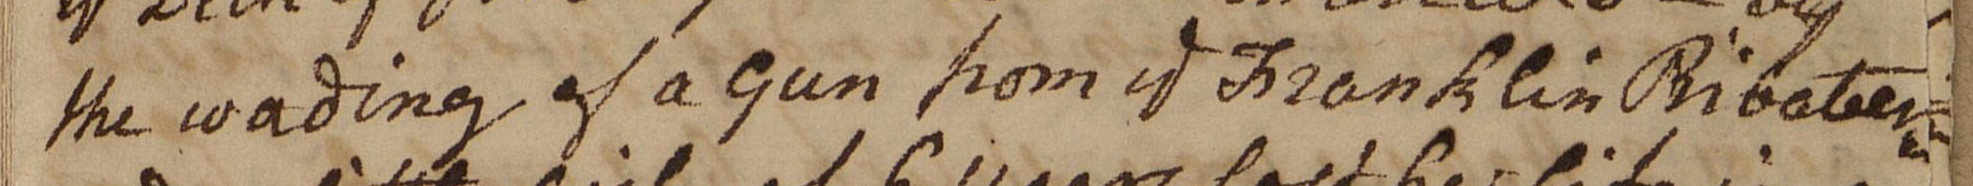the wading of a Gun from y^e Franklin Privateer
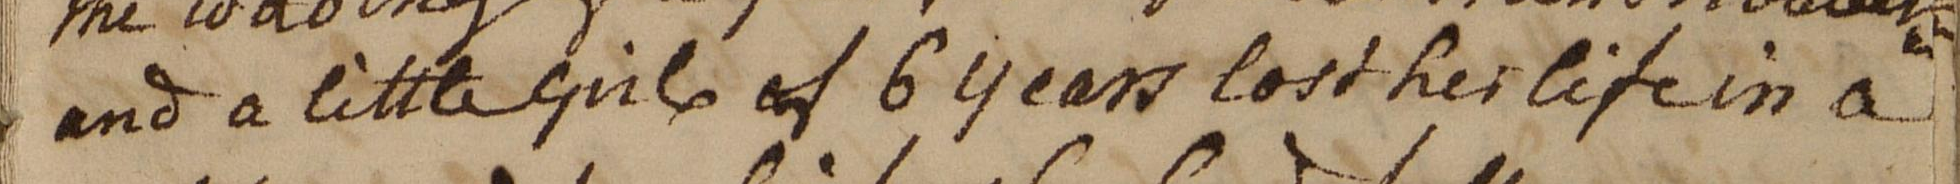and a little girl of 6 years lost her life in a
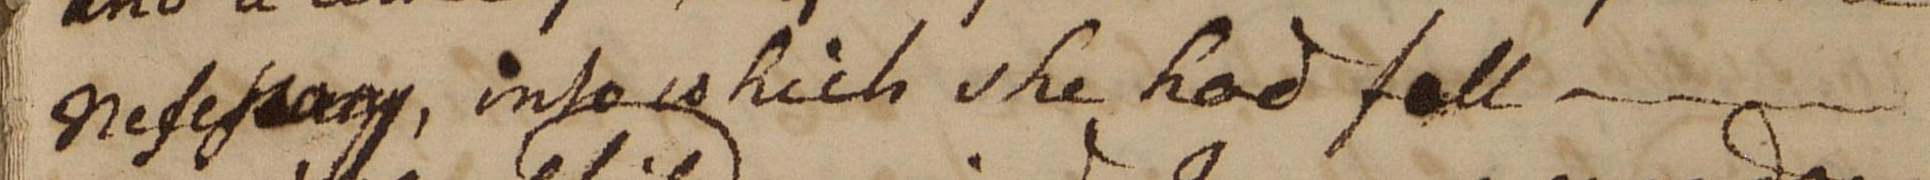Nesessary, into which she had fall-
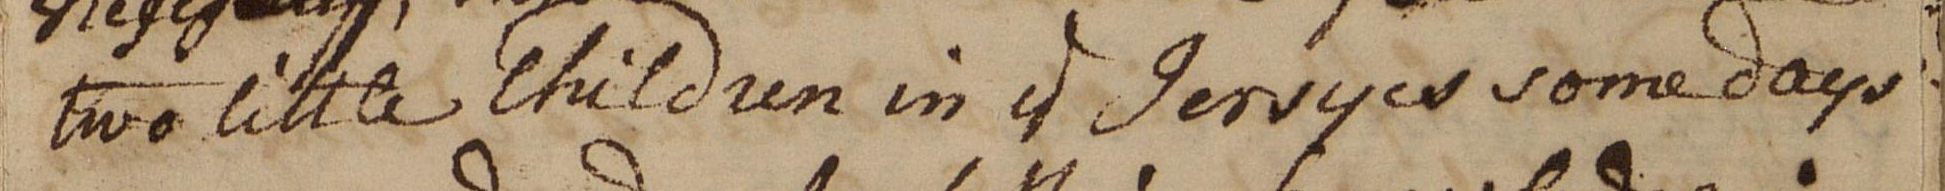two little Children in y^e Jersyes some days
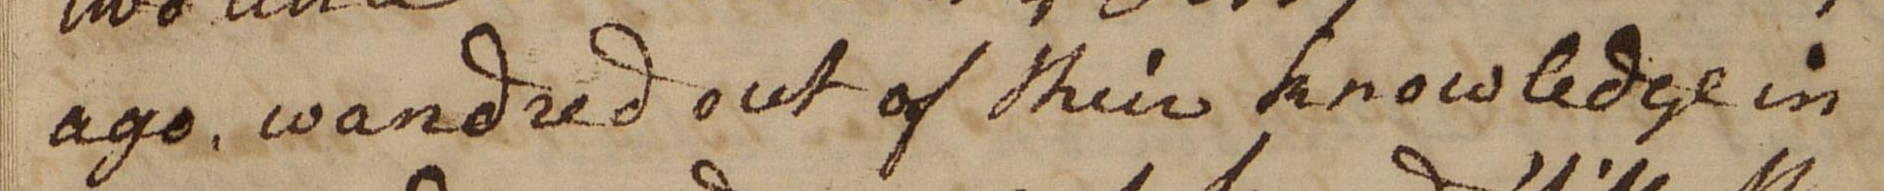ago, wandred out of their knowledge in
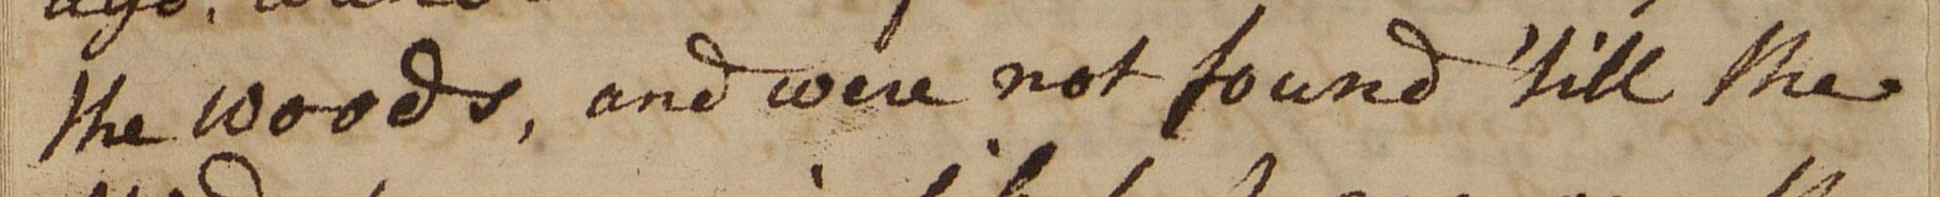the Woods, and were not found 'till the
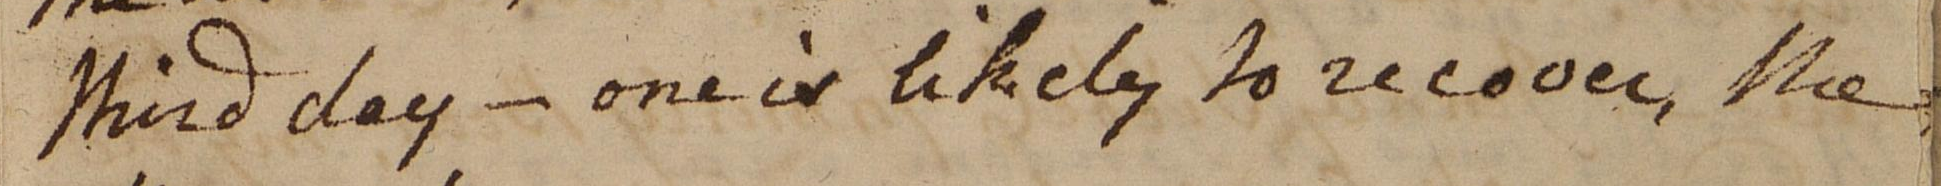third day- one is likely to recover, the
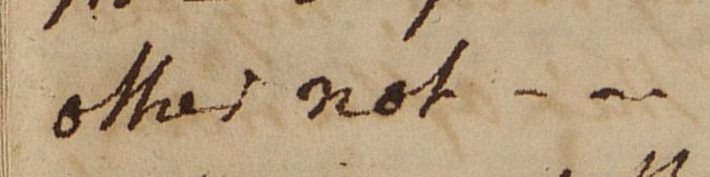other not--
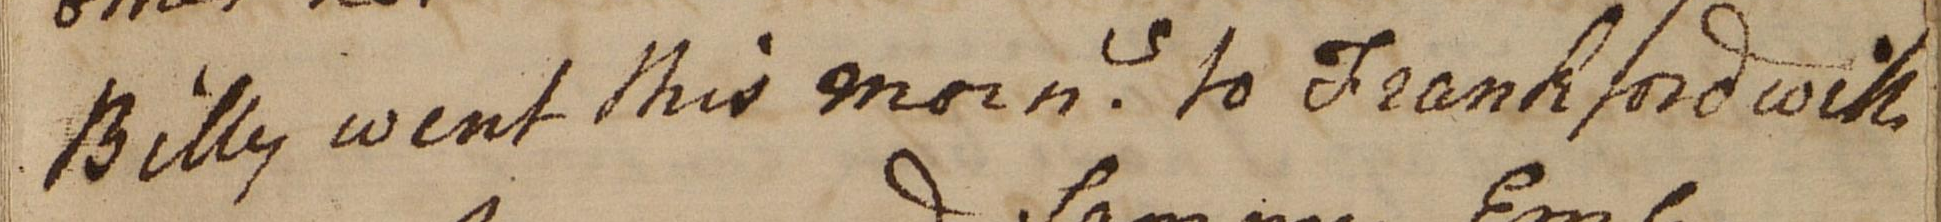Billy went this morn^g. to Frankford with
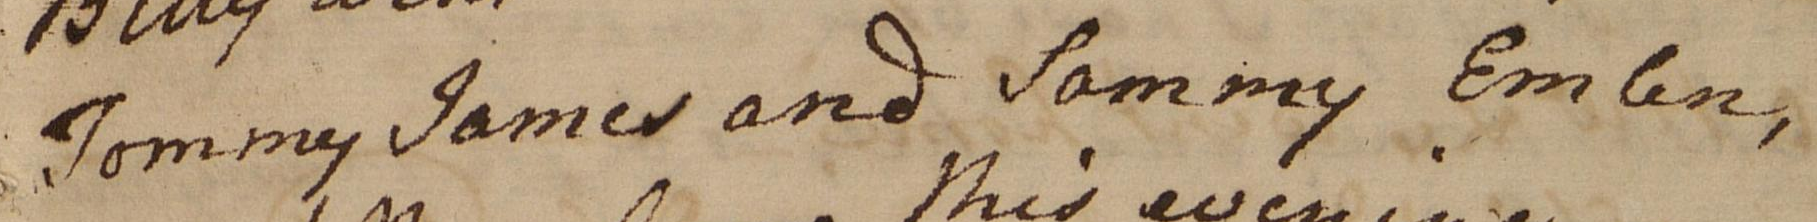Tommy James and Sammy Emlen,
